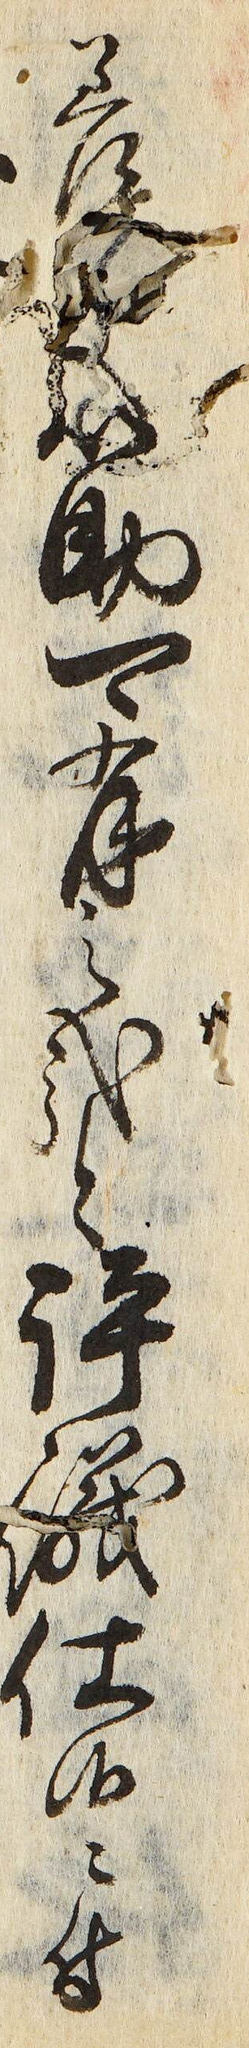差筋可有之哉と評儀仕候ニ付
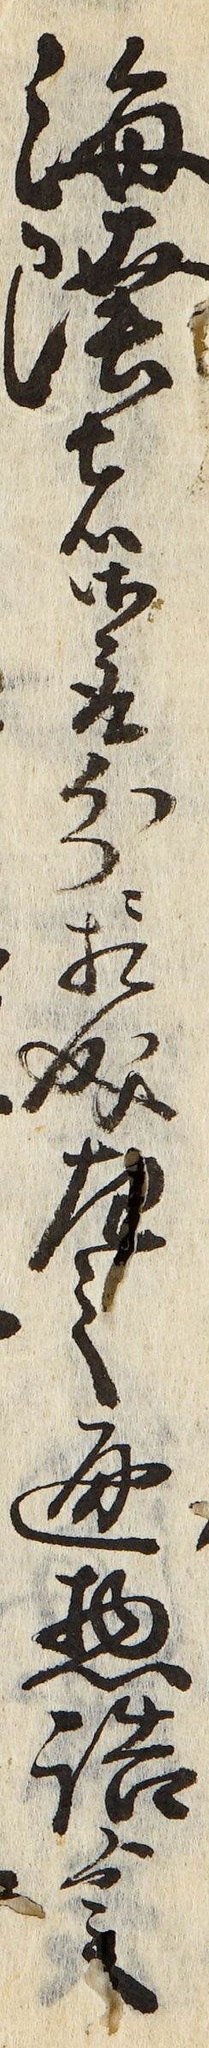海陸者御取分ニ相成左之通惣詰ゟ之
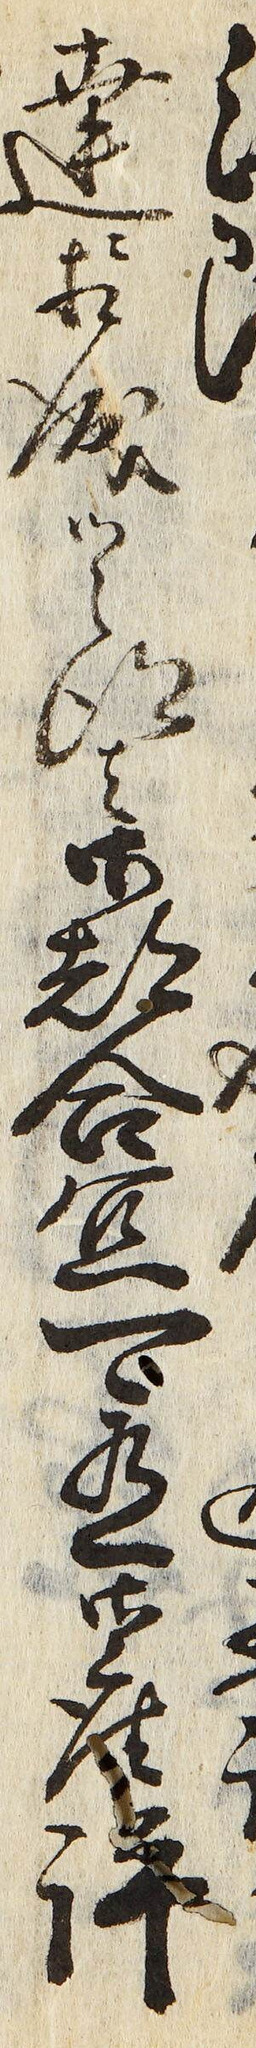達ニ相成候得者御都合宜可有御座評
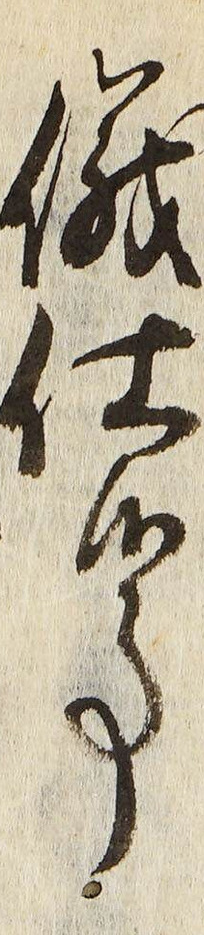儀仕候事
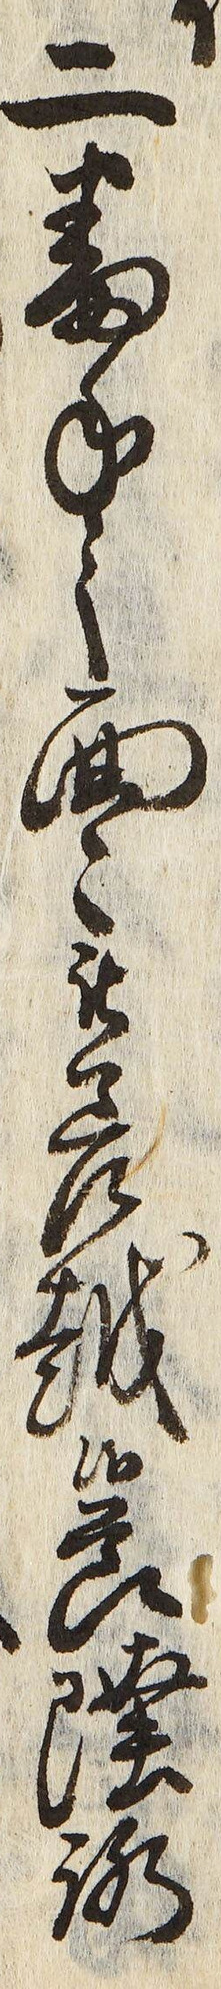二番手之面々被差越候節陸路
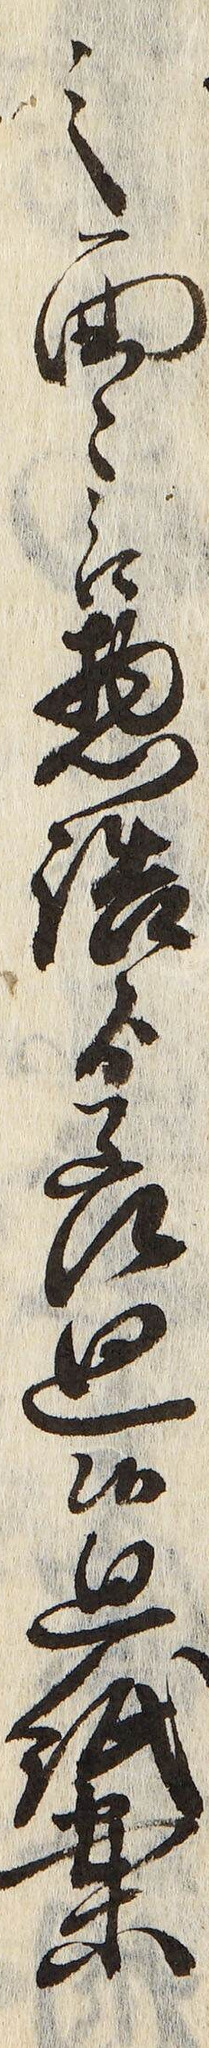之面々江惣詰ゟ差廻候廻紙案
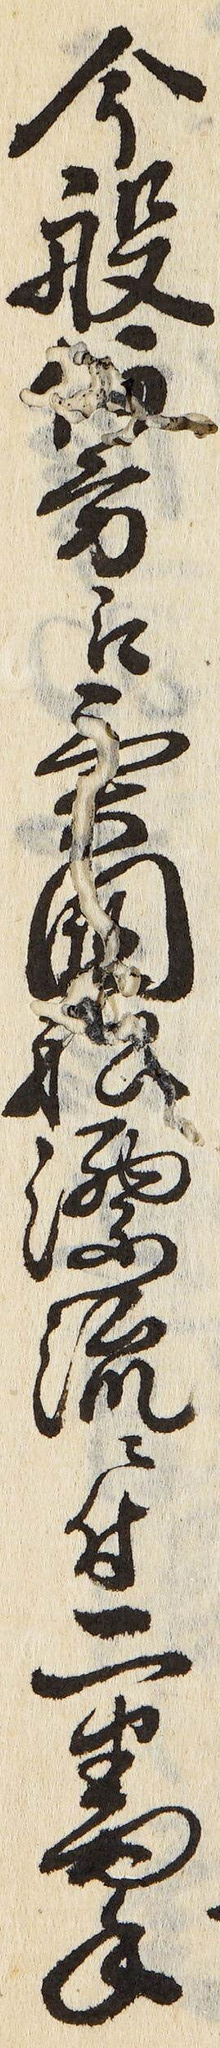今般何方江異国船漂流ニ付二番手
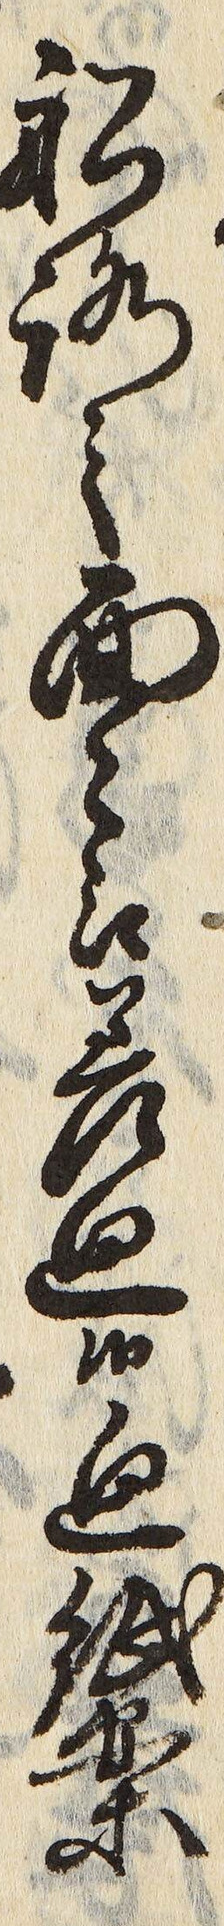船路之面々江差廻候廻紙案
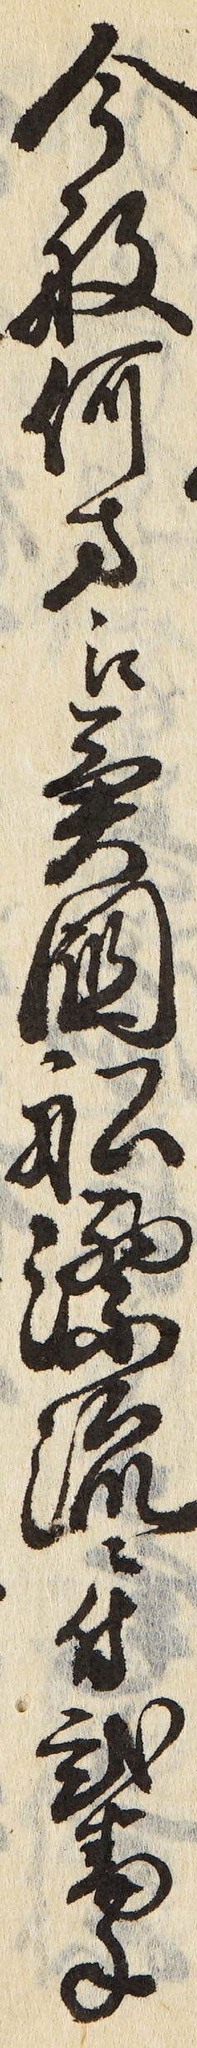今般何方江異国船漂流ニ付弐番手
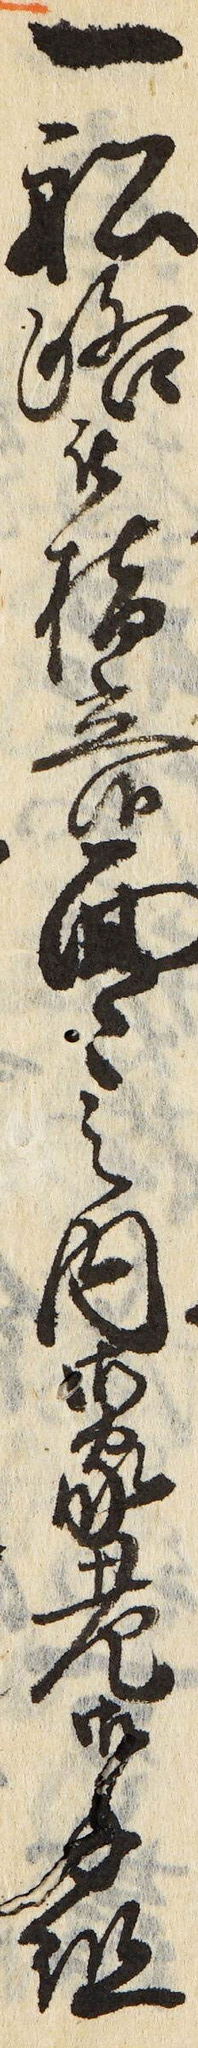一船路被指立候面々之内御家老御手組
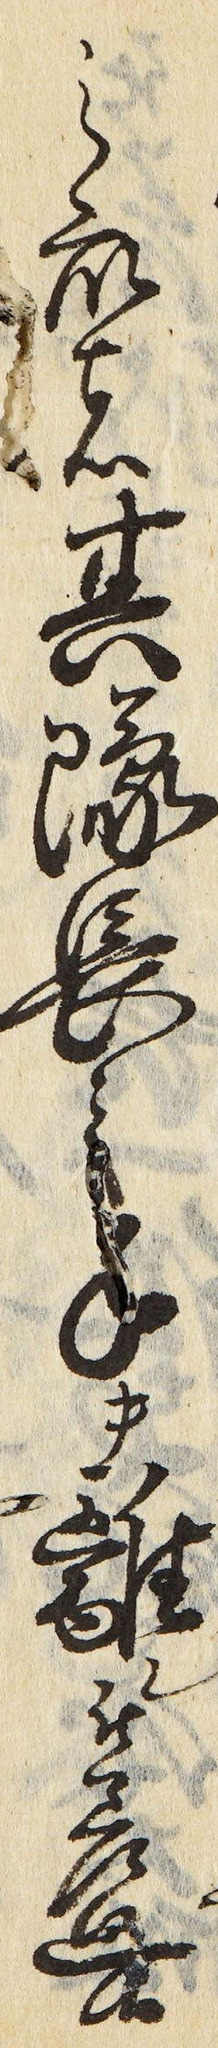之衆者其隊長之手ヲ離レ被差廻候
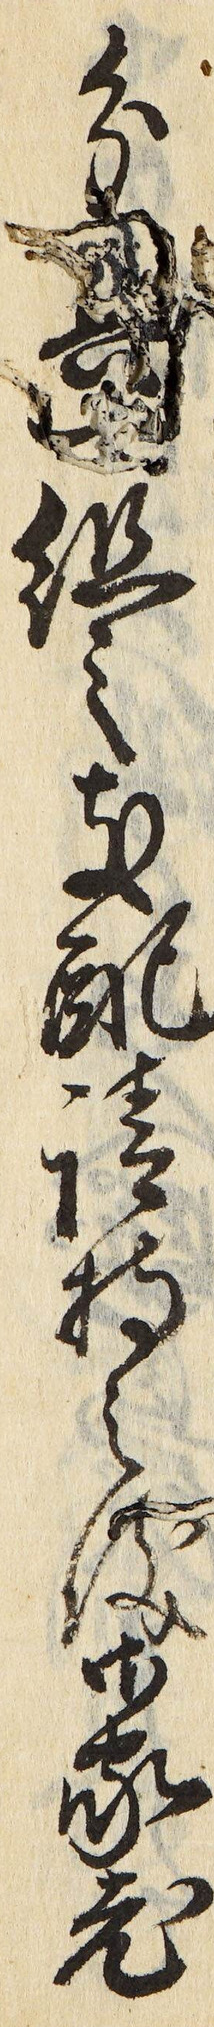分組之支配請持之儀御家老

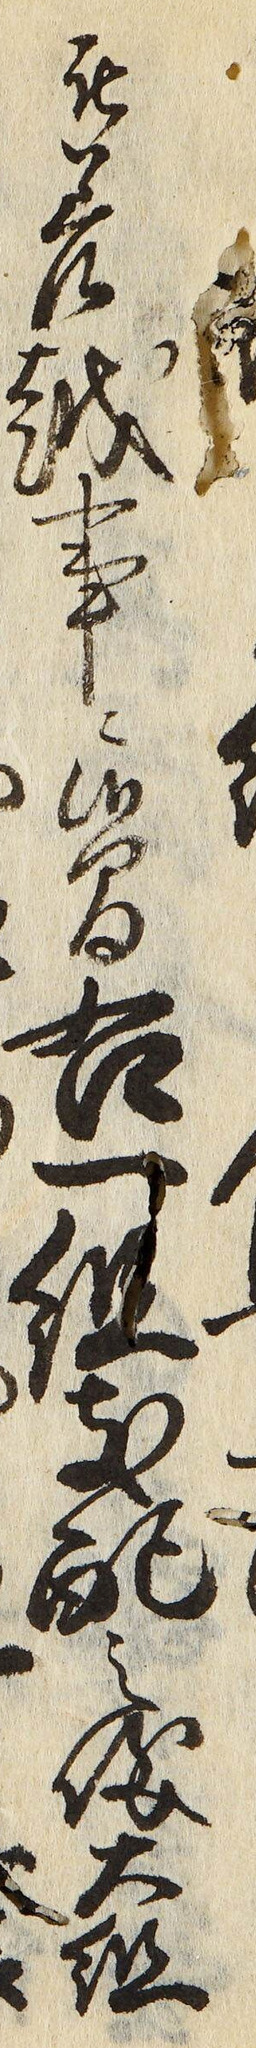被差越事ニ候間右一組支配之儀大組
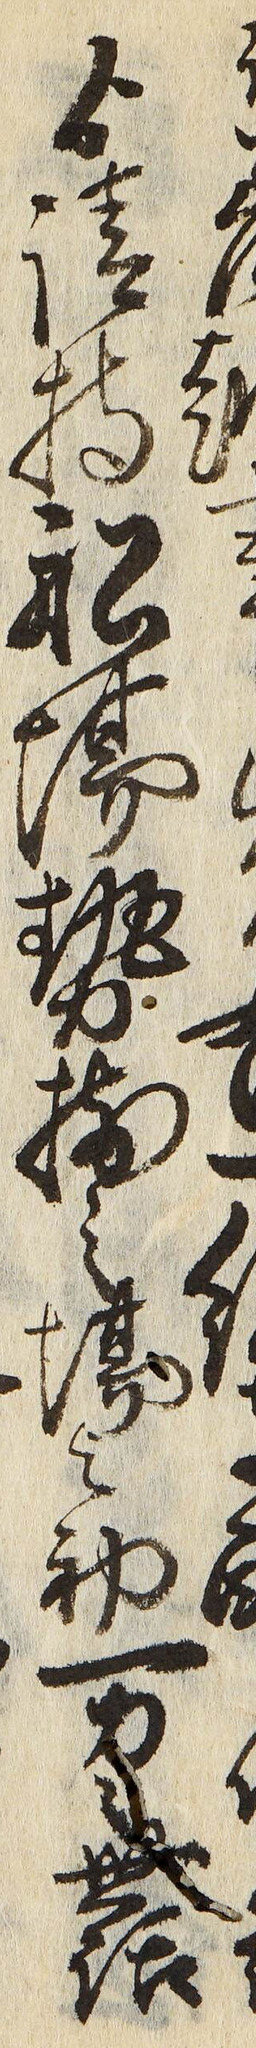ゟ請持船場勢揃之場与初万々世話
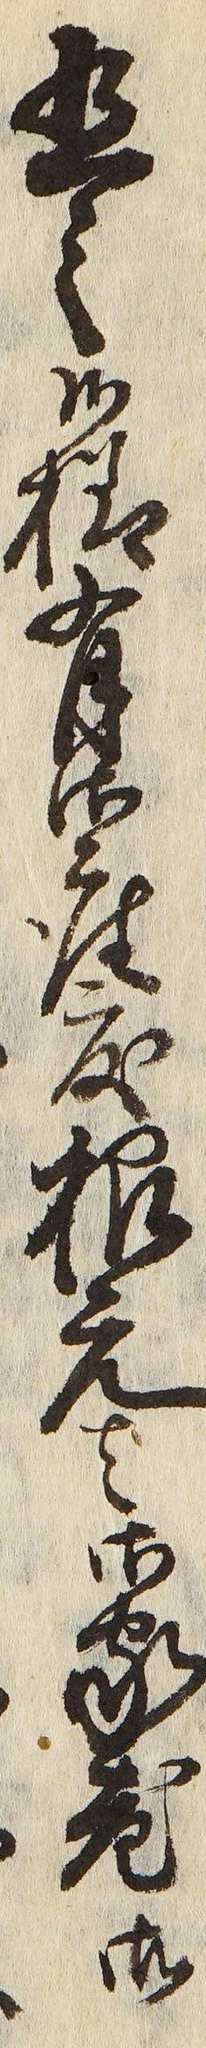有之候様有御座度根元者御家老御
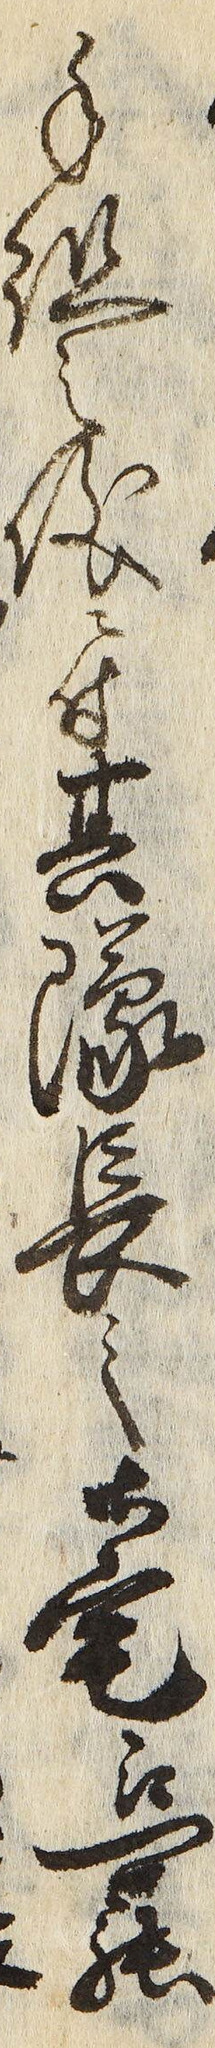手組之儀ニ付其隊長之御宅江可罷
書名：御領海江異国船漂流有之節御手当之次第大組頭心得之廉々書集記
